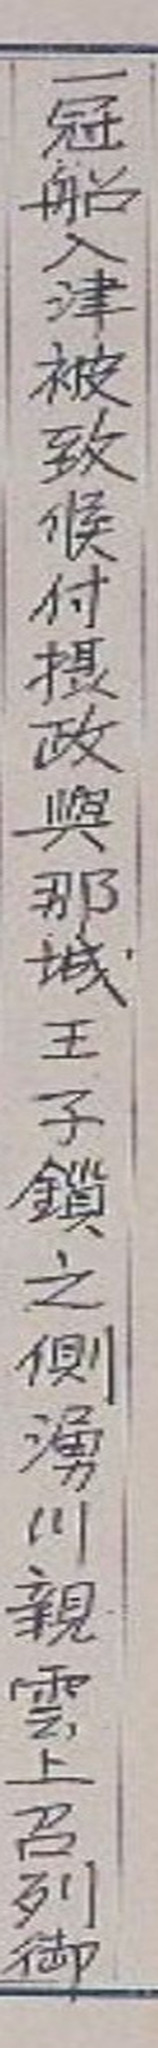冠船入津被致候付摂政与那城王子鎖之側湧川親雲上召列御
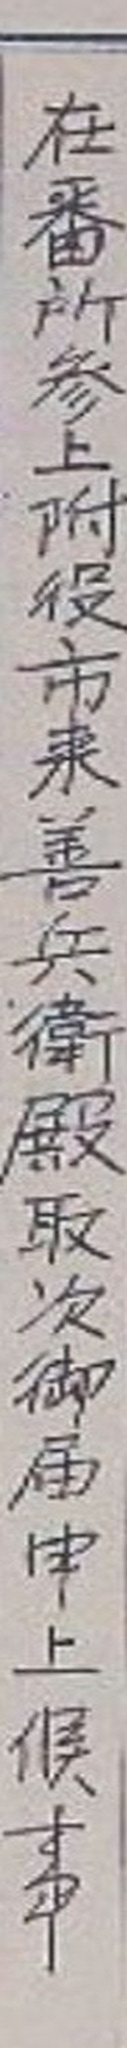在番所参上附役市来善兵衛殿取次御届申上候事
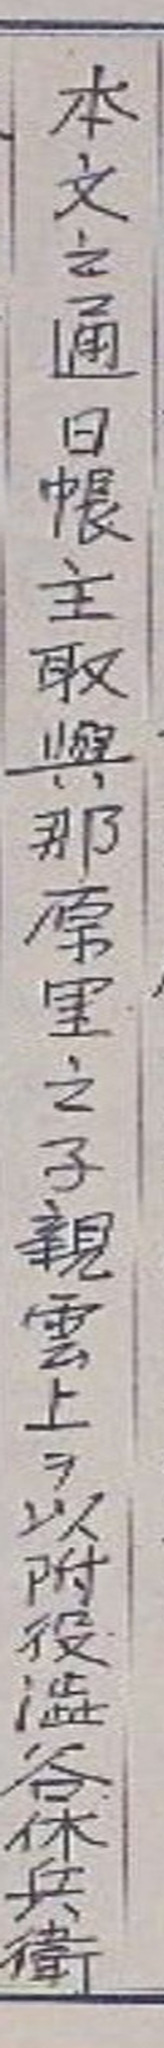本文之通日帳主取与那原里之子親雲上を以附役渋谷休兵衛
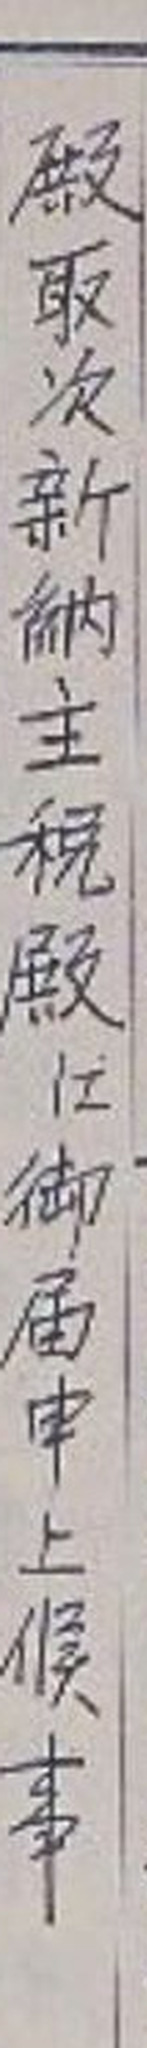殿取次新納主税殿え御届申上候事
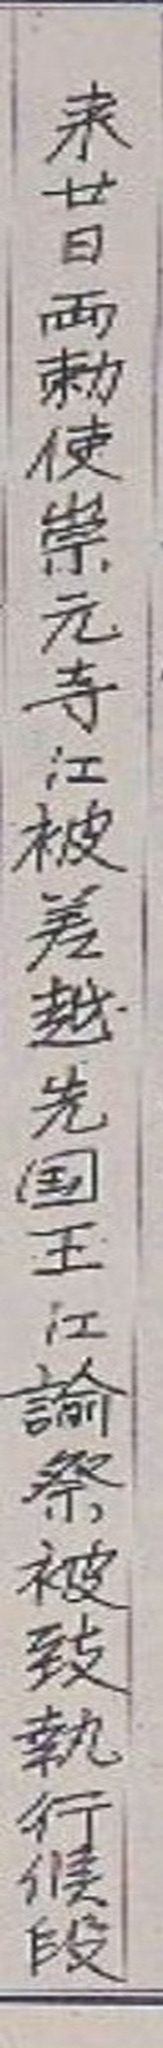来廿日両勅使崇元寺え被差越先国王え諭祭被致執行候段
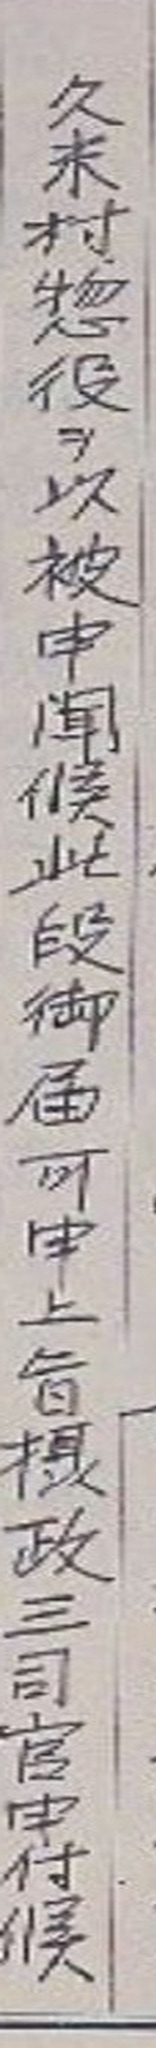久米村惣役を以被申聞候此段御届可申上旨摂政三司官申付候
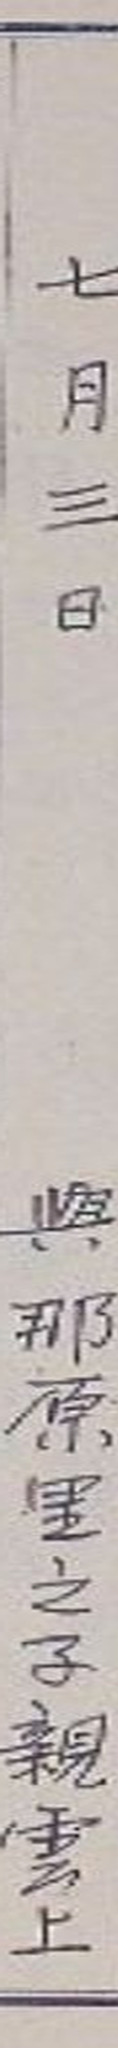七月三日与那原里之子親雲上
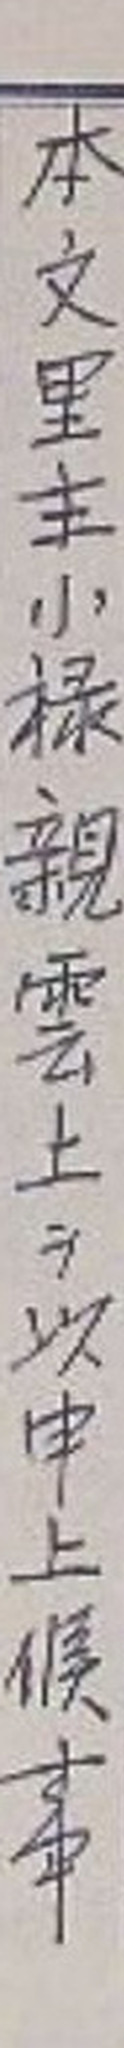本文里主小禄親雲上を以申上候事
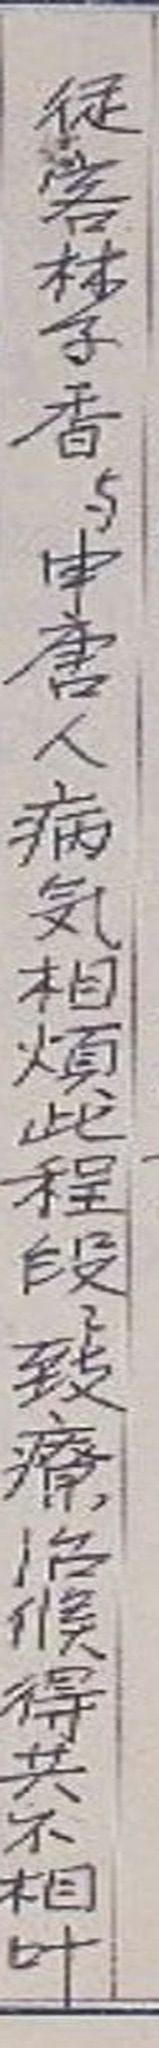従客林子香と申唐人病気相煩此程段々致療治候得共不相叶
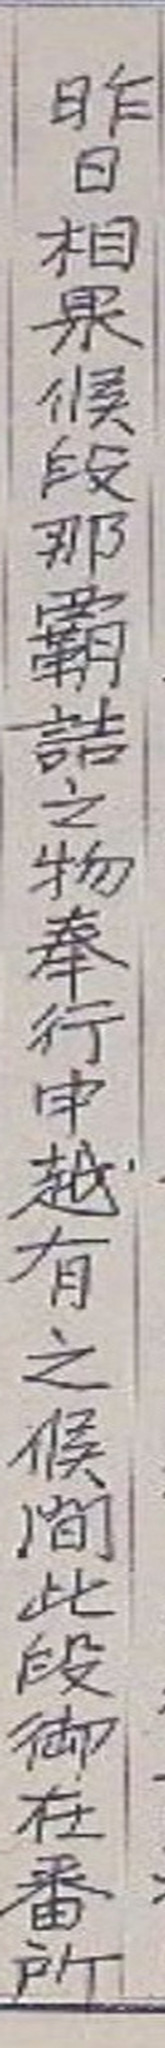昨日相果候段那覇詰之物奉行申越有之候間此段御在番所
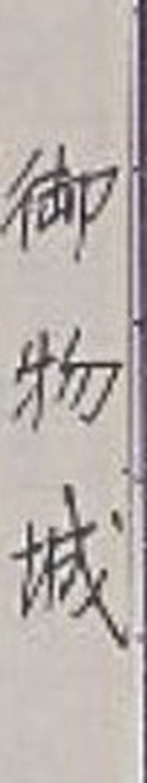御物成
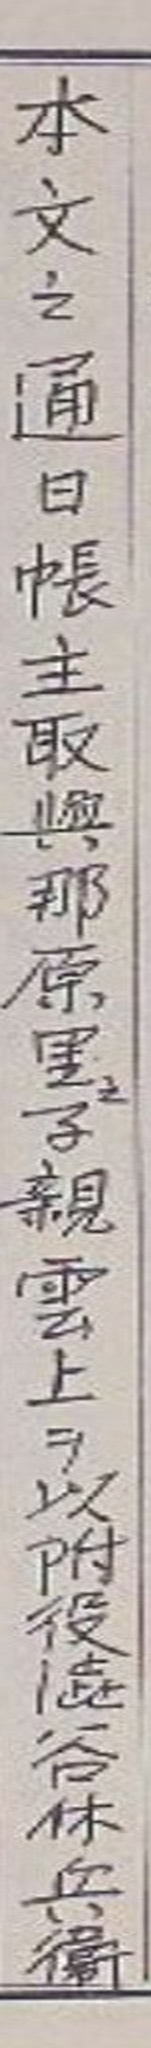本文之通日帳主取与那原里之子親雲上を以附役渋谷休兵衛
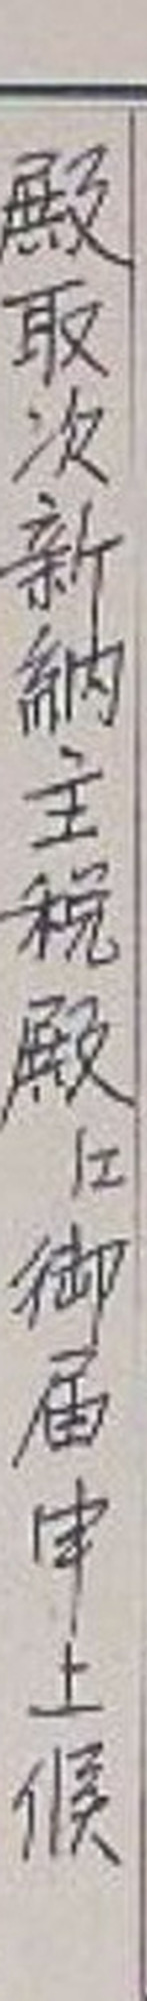殿取次新納主税殿え御届申上候
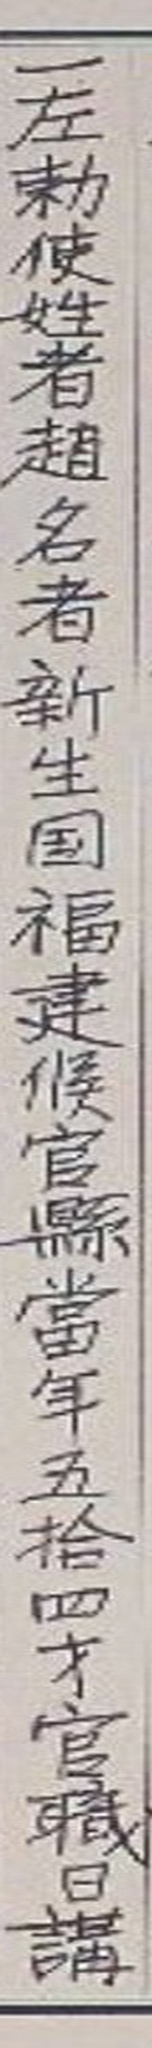一左勅使姓は趙名は新生国福建候官県当年五拾四才官職日講
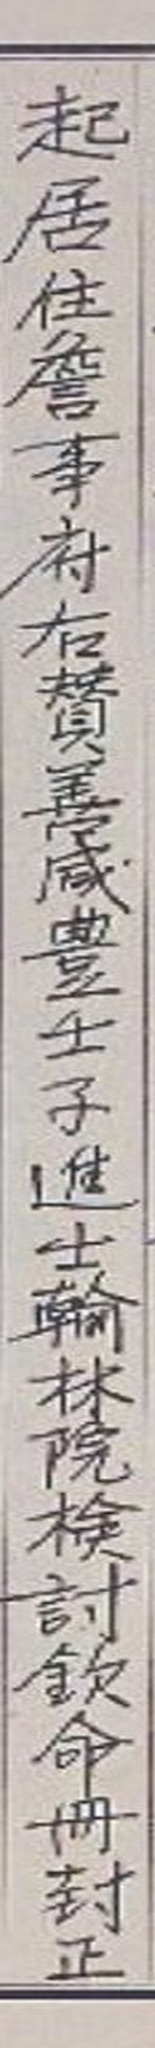起居住詹事府右賛善咸豊壬子進士翰林院検討欽命冊封正
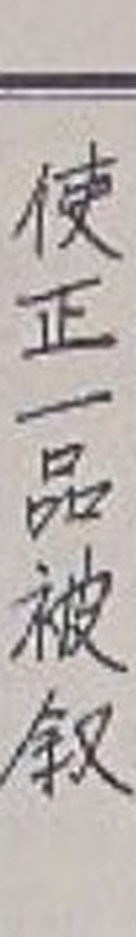使正一品被叙
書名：支那冊封使来琉諸記 下巻
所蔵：University of the Ryukyus Library
